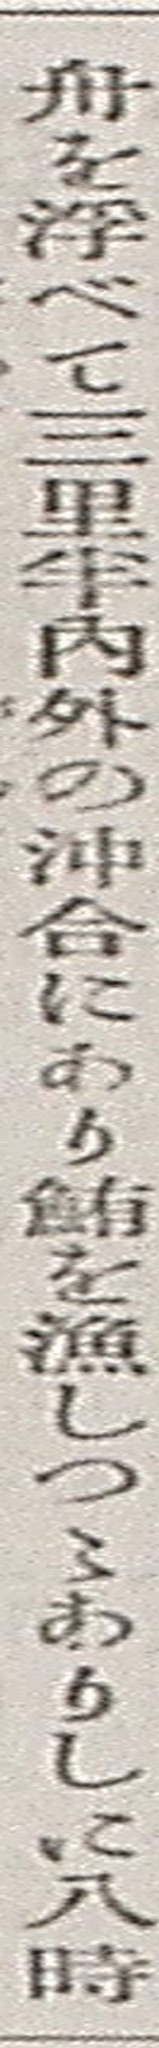舟を浮べて三里半内外の沖合にあり鮪を漁しつ〻ありしに八時
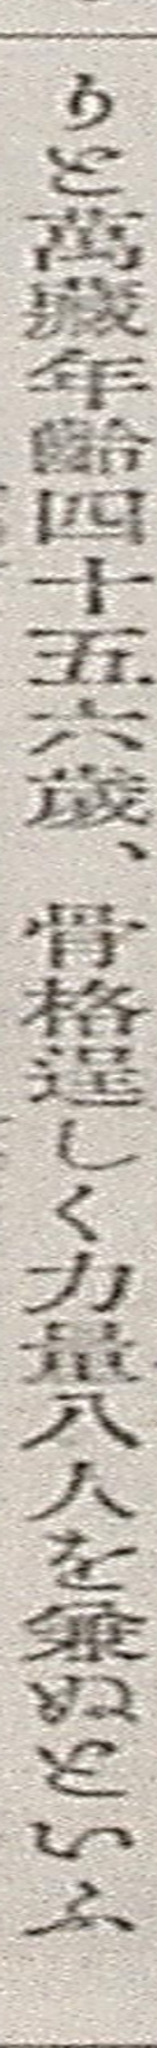りと万蔵年齢四十五六歳、骨格逞しく力量八人を兼ぬといふ
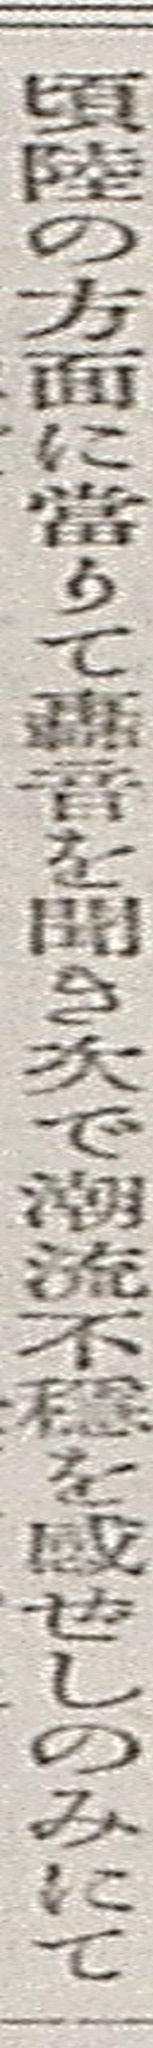頃陸の方面に当りて轟音を聞き次で潮流不穏を感ぜしのみにて
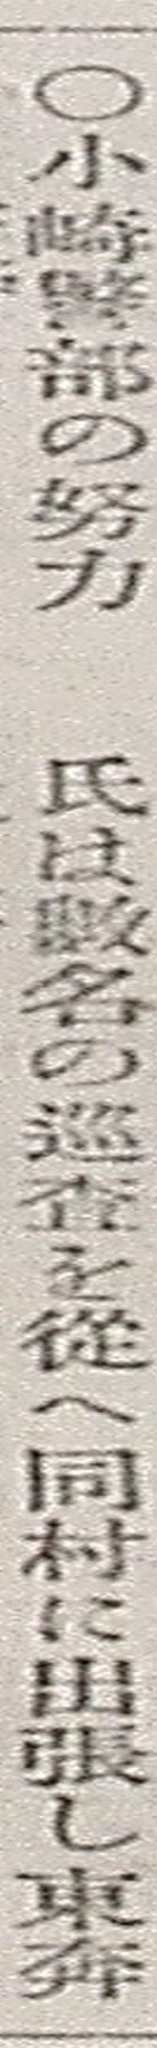○小崎警部の努力氏は数名の巡査を従へ同村に出張し東奔
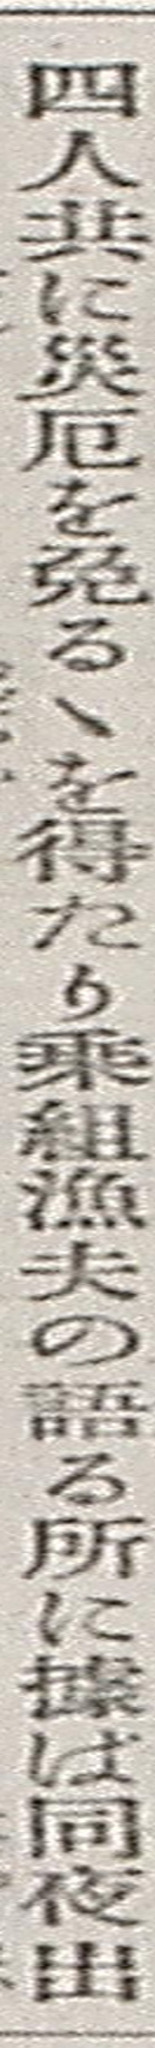四人共に災厄を免るゝを得たり乗組漁夫の語る所に拠ば同夜出
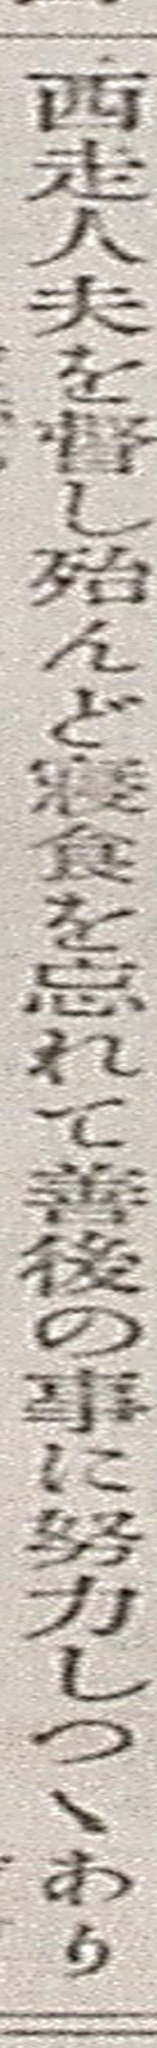西走人夫を督し殆んど寝食を忘れて善後の事に努力しつゝあり
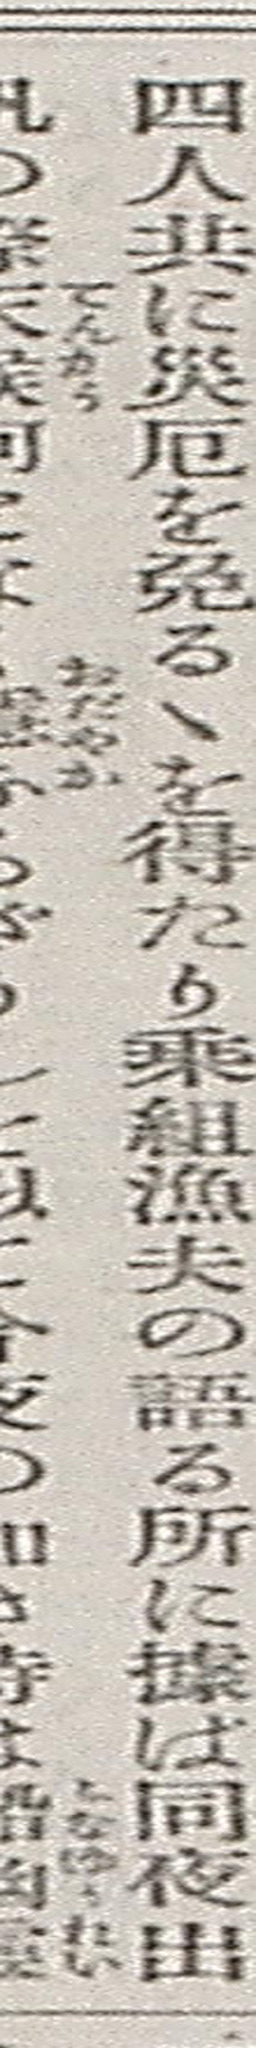帆の際天候何となく穏ならざりしを以て今夜の如き時は船幽霊
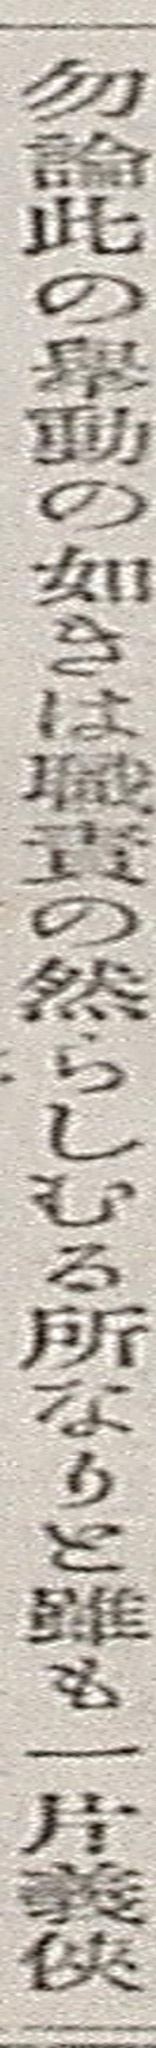勿論此の挙動の如きは職責の然らしむる所なりと雖も一片義侠
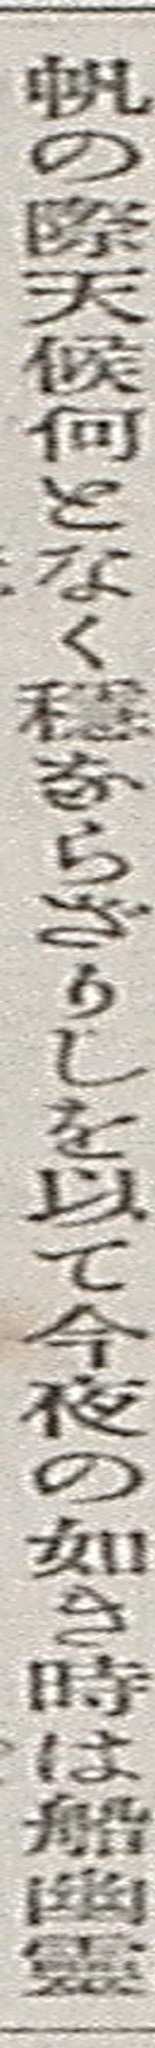帆の際天候何となく穏ならざりしを以て今夜の如き時は船幽霊
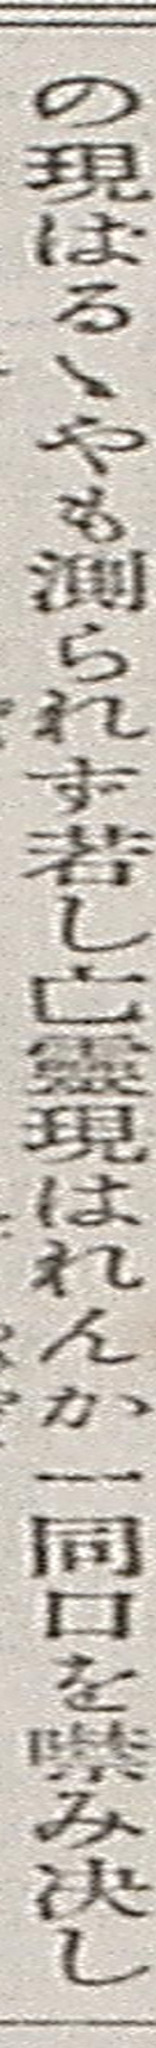の現はるゝやも測られず若し亡霊現はれんか一同口を噤み決し
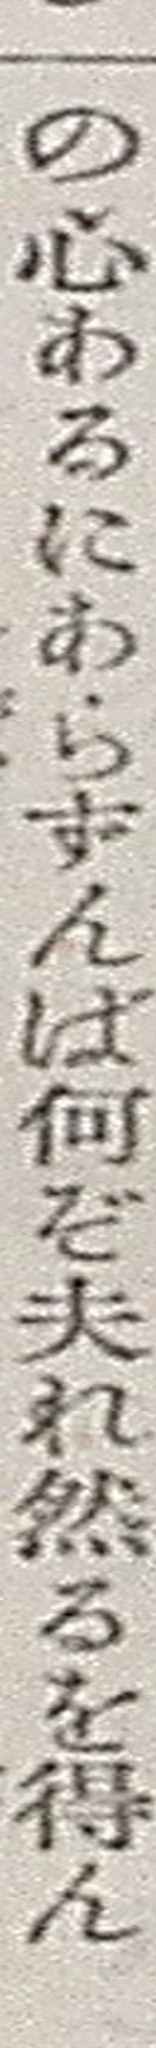の心あるにあらずんば何ぞ夫れ然るを得ん
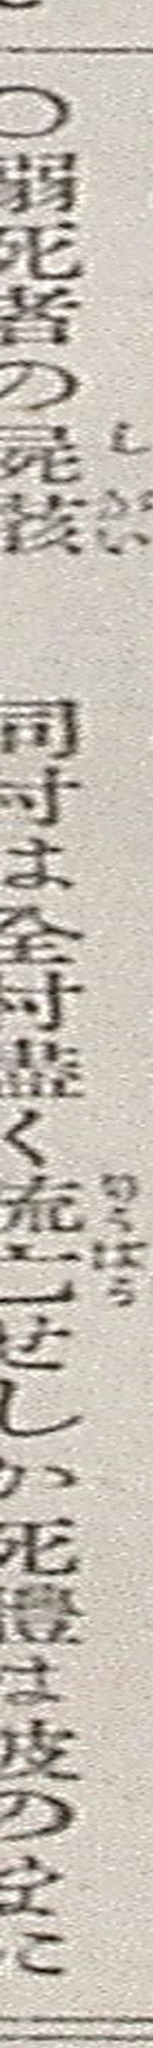○溺死者の屍骸同村は全村尽く流亡せしか死体は並のまに
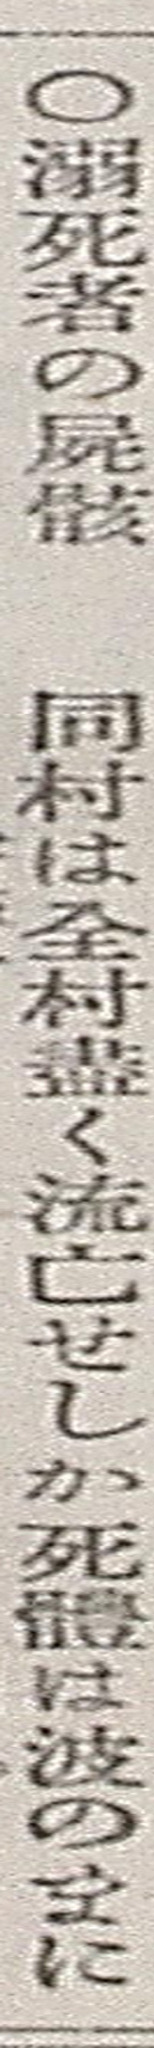○溺死者の屍骸同村は全村尽く流亡せしか死体は並のまに
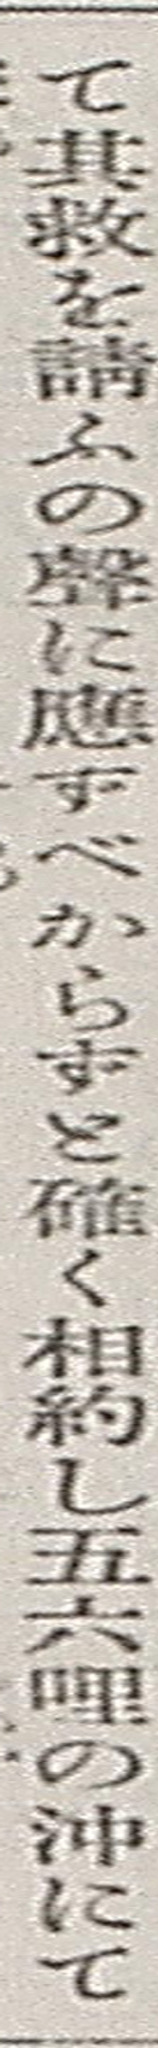て其救を請ふの声に応ずべからずと確く相約し五六哩の沖にて
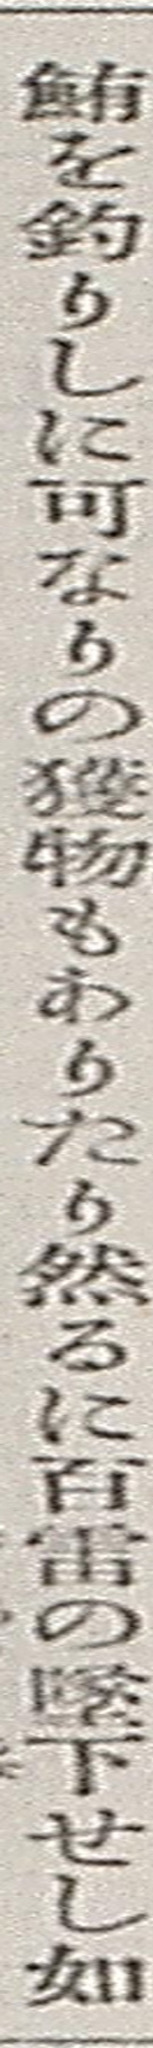鮪を釣りしに可なりの獲物もありたり然るに百雷の墜下せし如
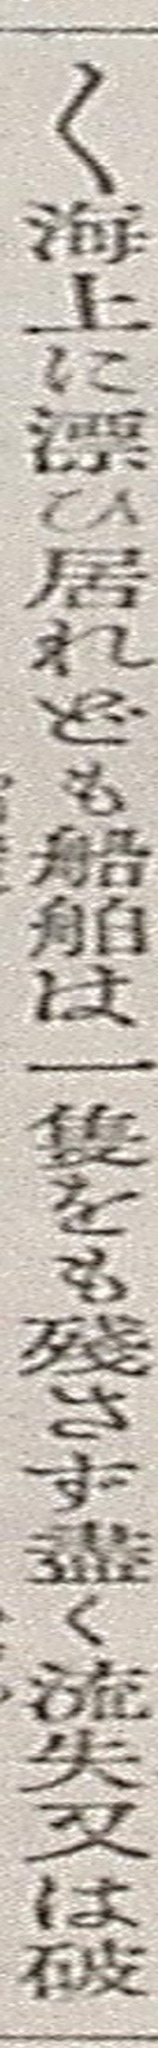〳〵海上に漂ひ居れども船舶は一隻をも残さず尽く流失又は破
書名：風俗畫報臨時増刊第百十九號　大海嘯被害録（中）
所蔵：東京大学地震研究所図書室 Earthquake Research Institute Library, The University of Tokyo, JAPAN
